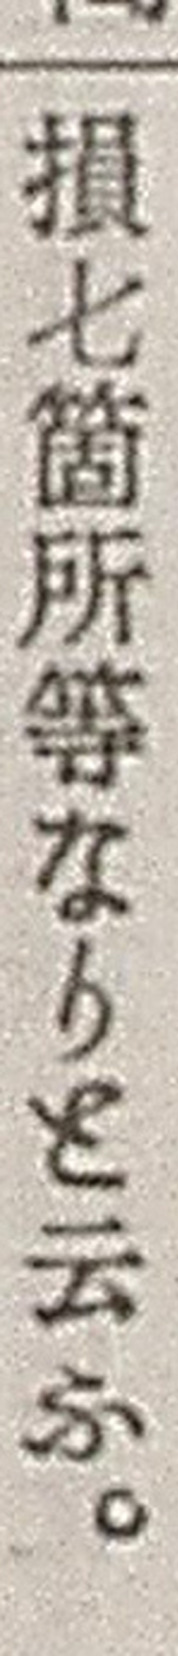損七箇所等なりと云ふ。
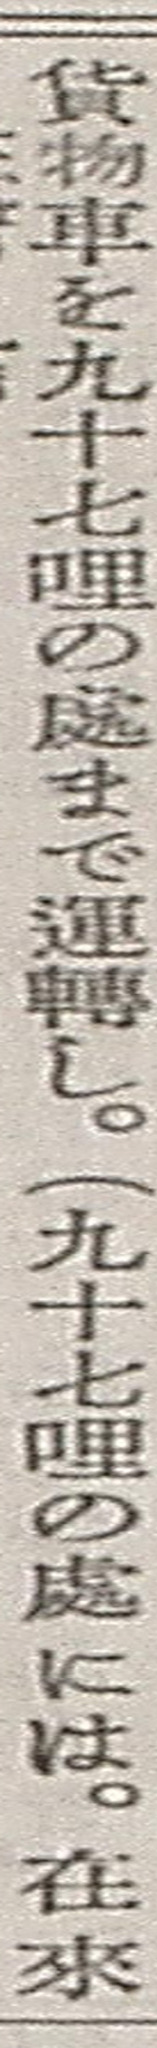貨物車を九十七哩の処まで運転し。（九十七哩の処には。在来
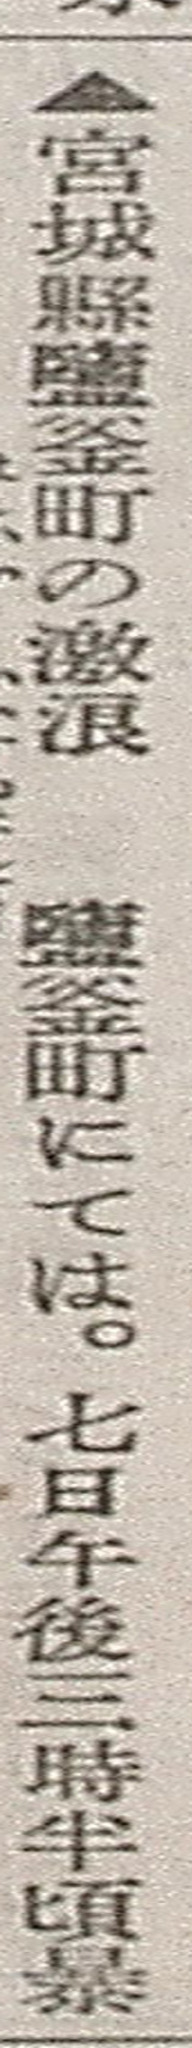▲宮城県塩釜町の激浪塩釜町にては。七日午後三時半頃暴
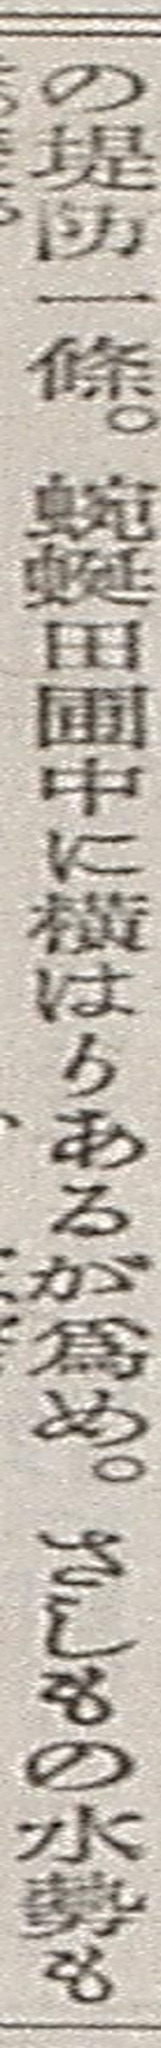の堤防一条。蜿蜒田圃中に横はりあるが為め。さしもの水勢も
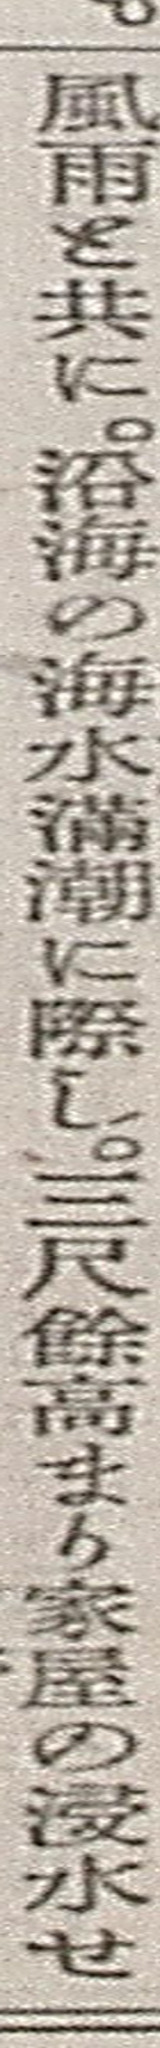風雨と共に。沿海の海水満潮に際し。三尺余高まり家屋の浸水せ
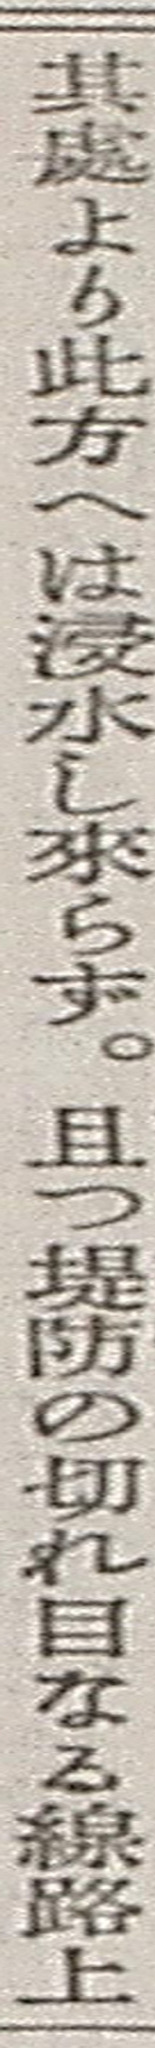其処より此方へは浸水し来らず。且つ堤防の切れ目なる線路上
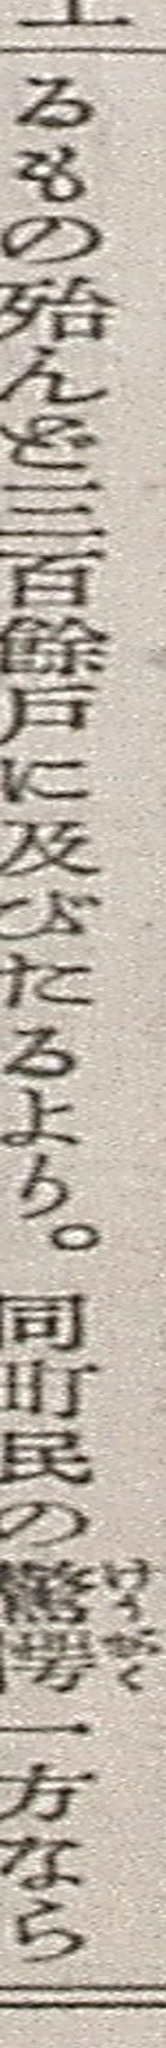るもの殆んど三百余戸に及びたるより。同町民の驚愕一方なら
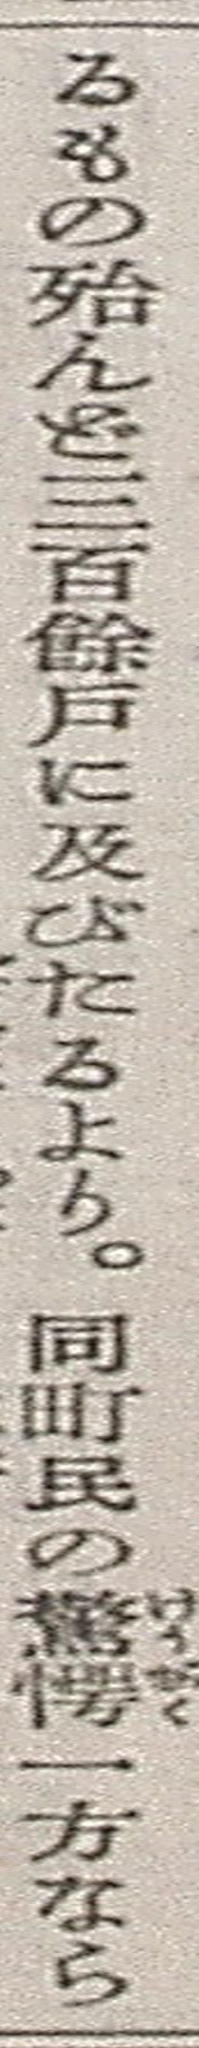るもの殆んど三百余戸に及びたるより。同町民の驚愕一方なら
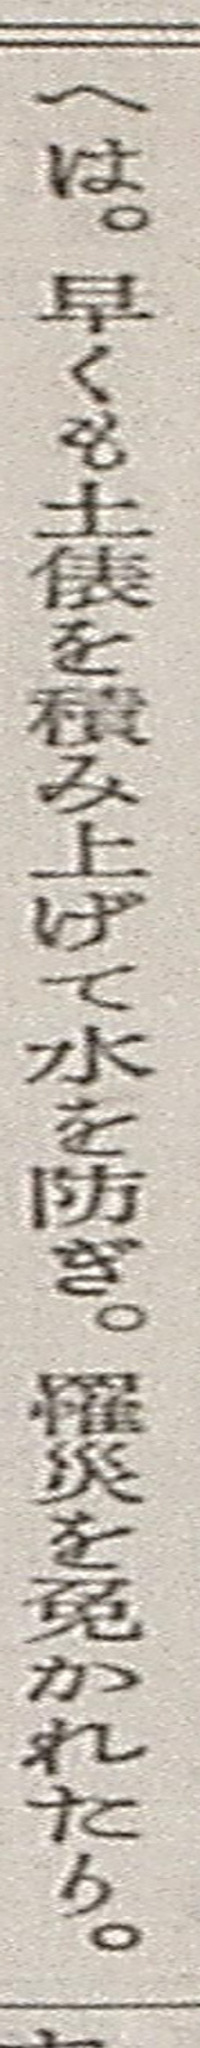へは。早くも土俵を積み上げて水を防ぎ。罹災を免かれたり。
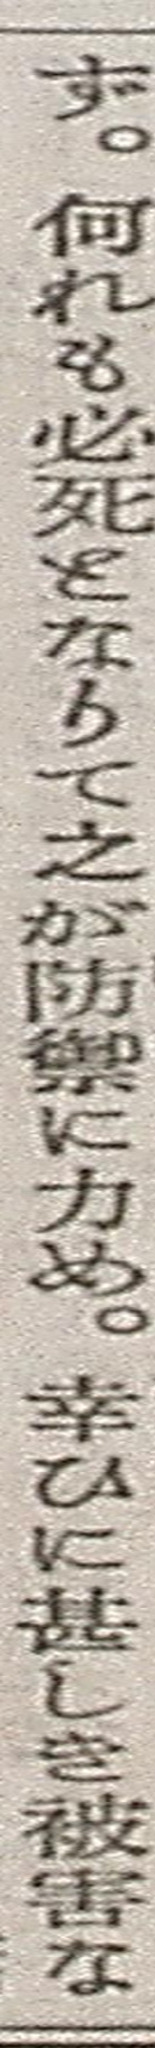ず。何れも必死となりて之が防禦に力め。幸ひに甚しき被害な
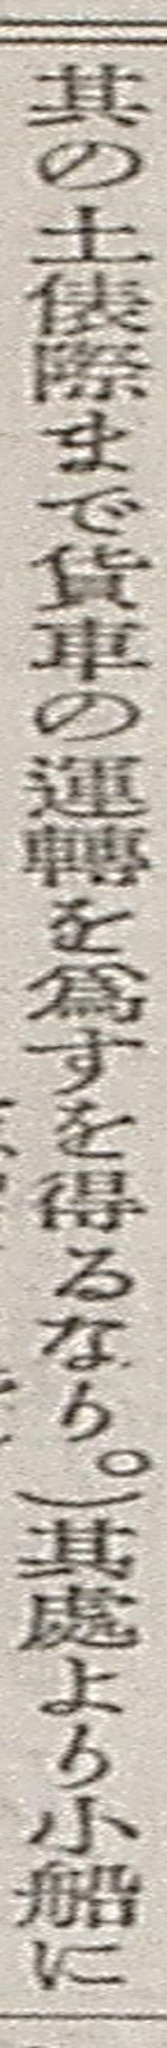其の土俵際まで貨車の運転を為すを得るなり。）其処より小船に
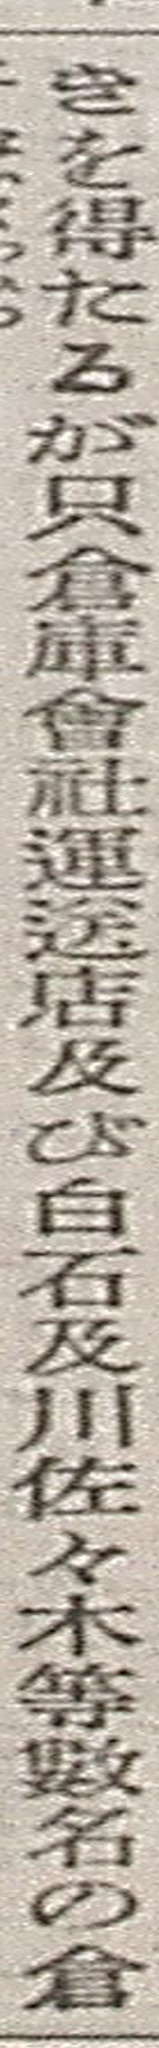きを得たるが只倉庫会社運送店及び白石及川佐々木等数名の倉
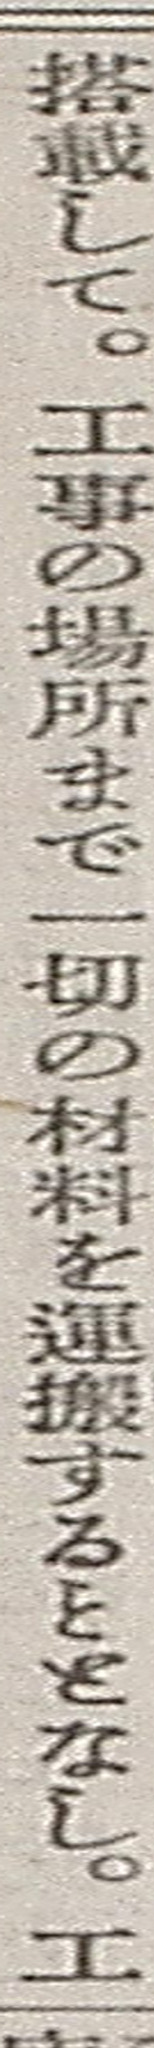搭載して。工事の場所まで一切の材料を運搬することとなし。工
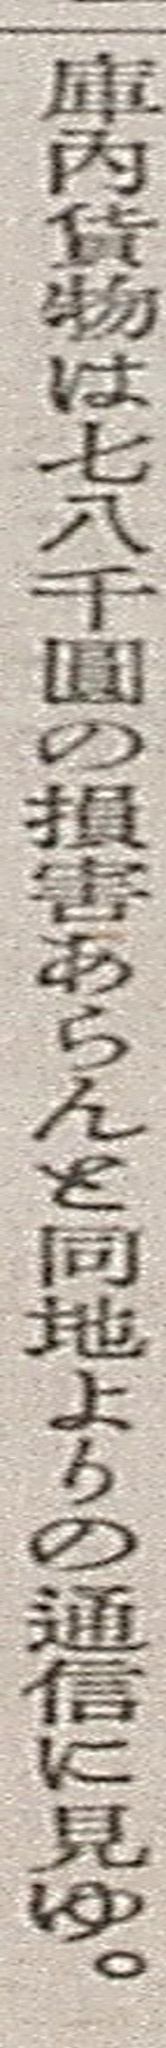庫内貨物は七八千円の損害あらんと同地よりの通信に見ゆ。
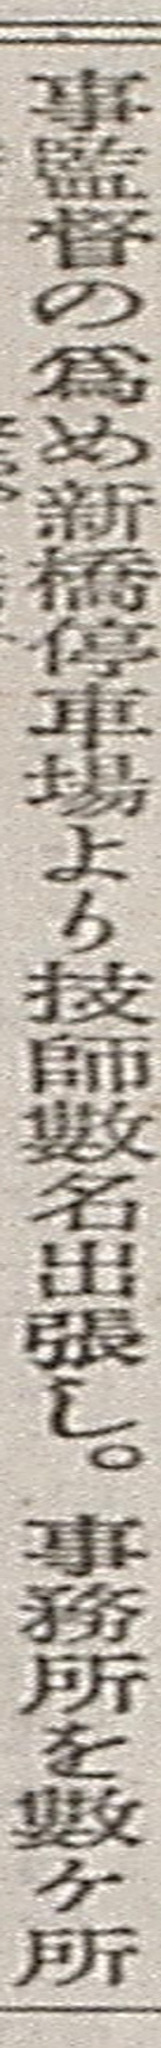事監督の為め新橋停車場より技師数名出張し。事務所を数ヶ所
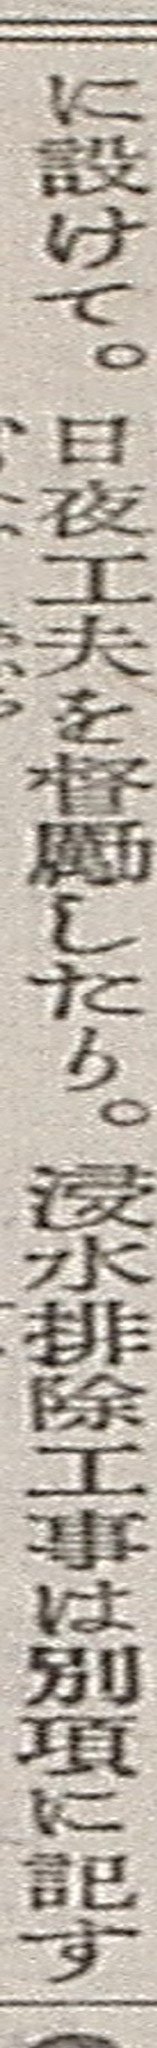に設けて。日夜工夫を督励したり。浸水排除工事は別項に記す
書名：風俗畫報臨時増刊第百九十九號　明治三十二年十月各地災害圖會（前編之續）
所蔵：東京大学地震研究所図書室 Earthquake Research Institute Library, The University of Tokyo, JAPAN
